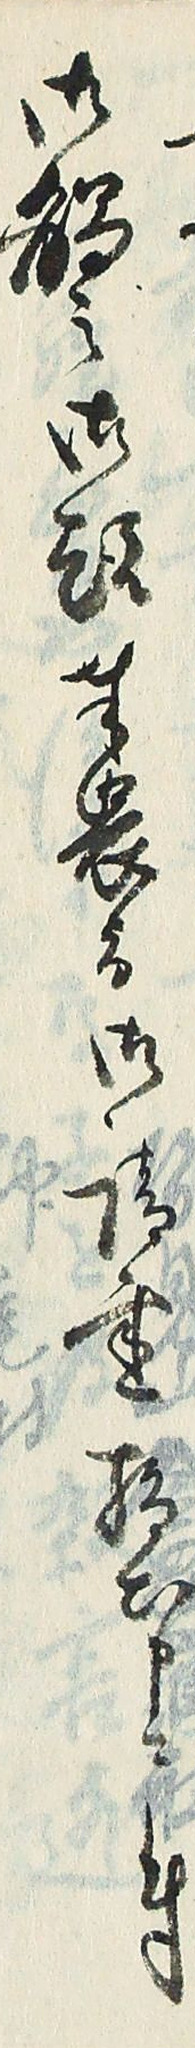御触之御趣奉畏旨御請書指出申に付
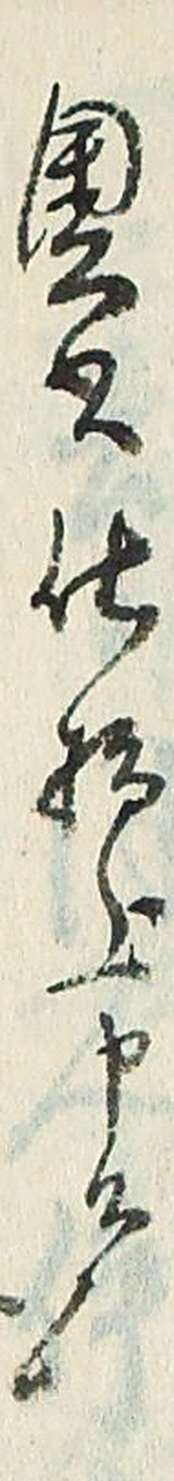奥書仕指上申候以上
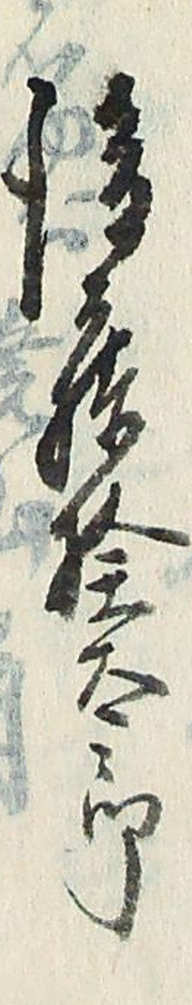後藤拴太郎
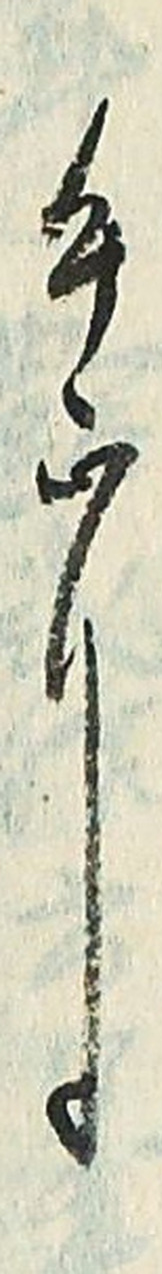午正月
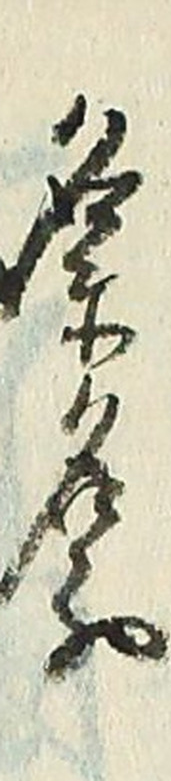名東名西
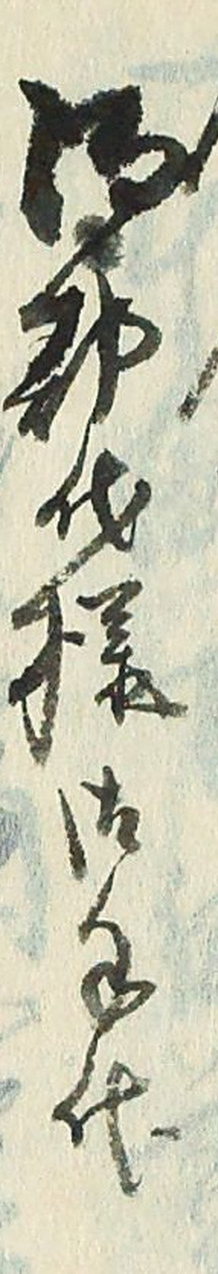御郡代様御手代
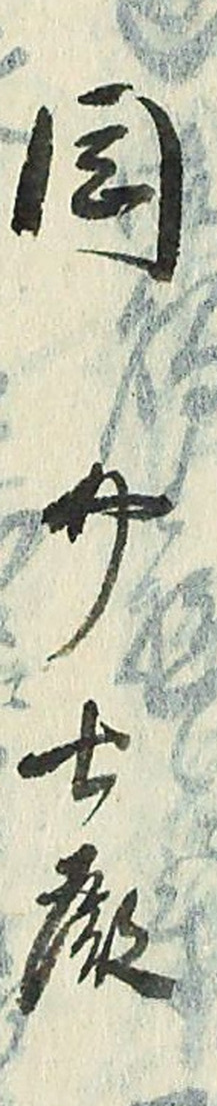岡介七殿
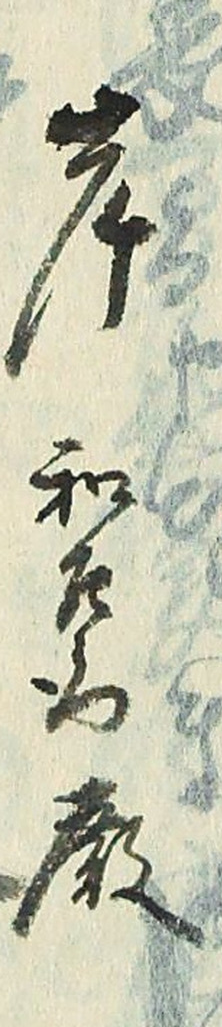岸和左衛門殿
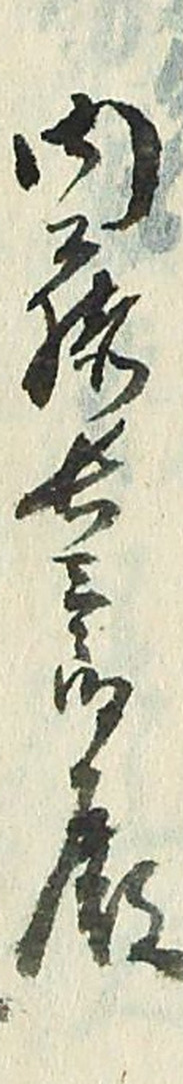内藤長三郎殿
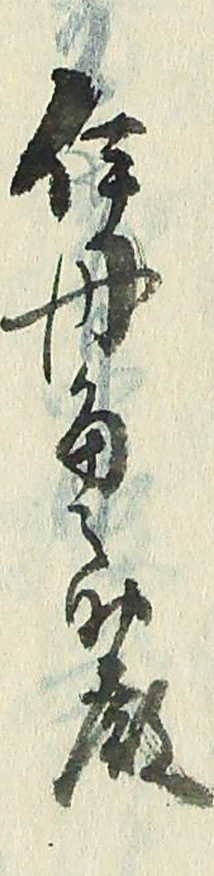伊丹角之助殿
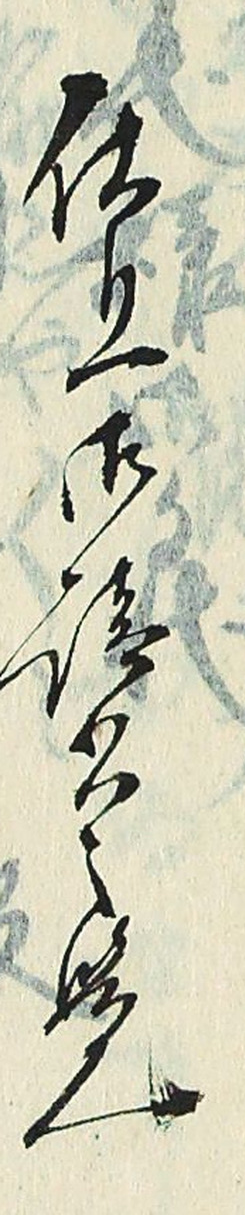仕上御請書之覚
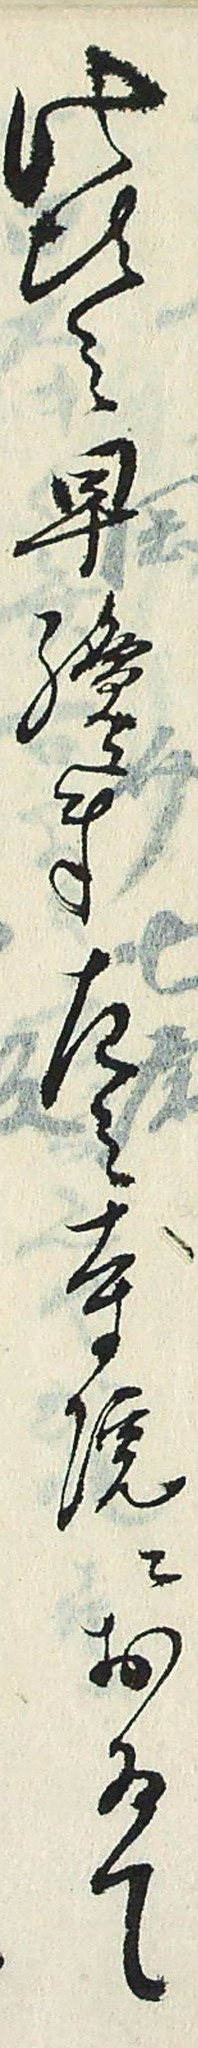此頃旱続に付き左之寺院におゐて
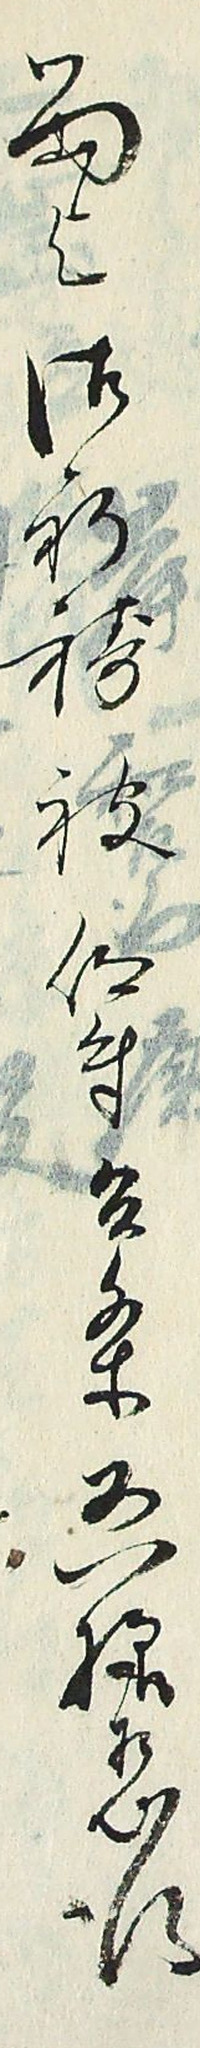雨乞御祈祷被仰付候条右様相心得
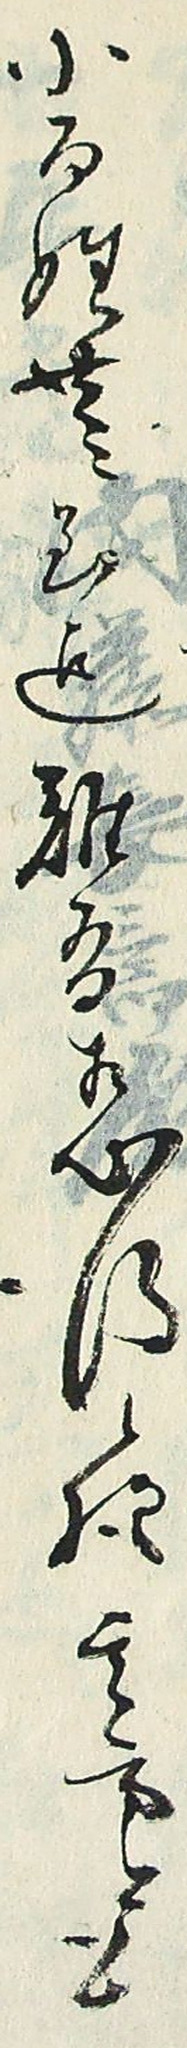小百姓共に至迄難有相心得候様其方とも

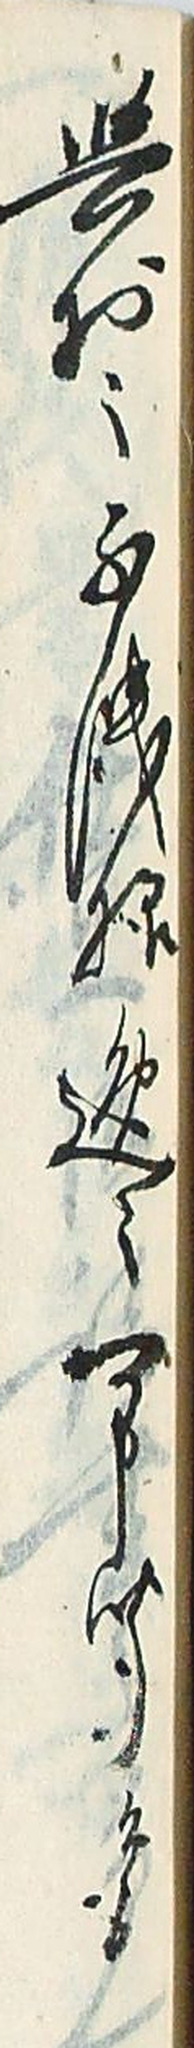与村々不洩様逸々可申聞候以上
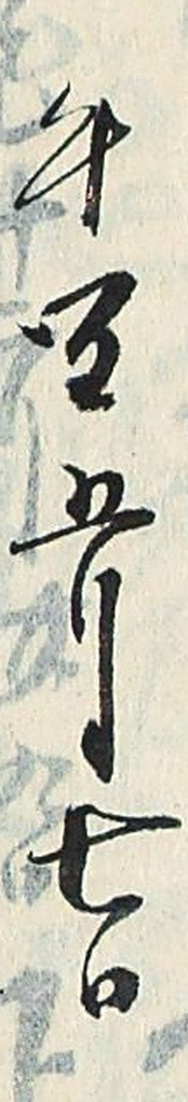午閏五月七日
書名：諸御用御□受書控
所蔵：鳴門教育大学 Naruto University of Education
